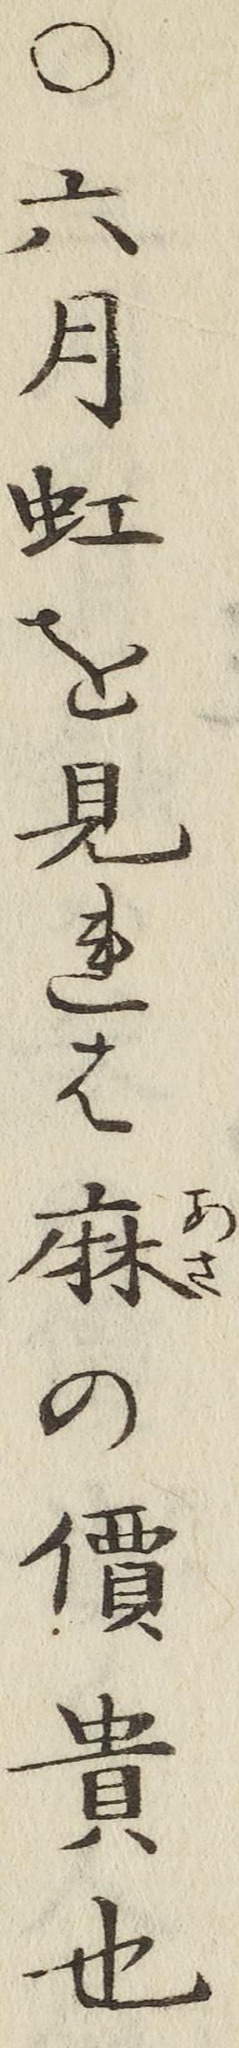○六月虹を見れは麻の価貴也
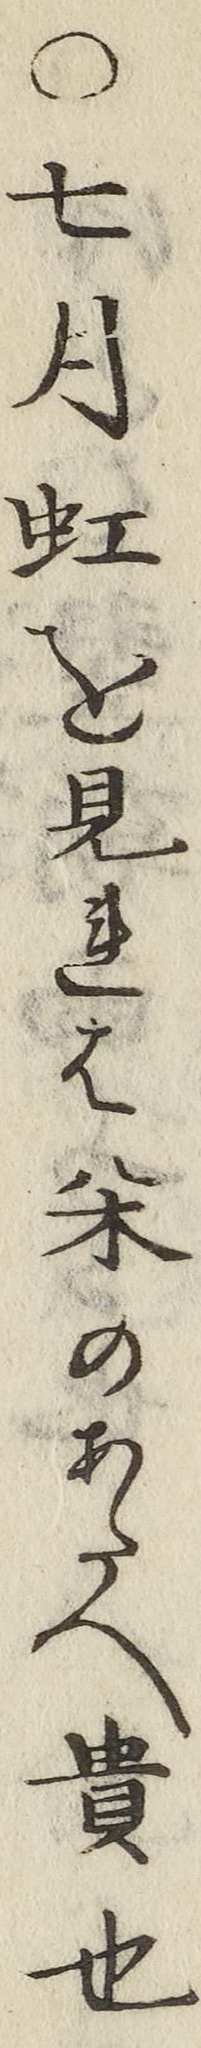○七月虹を見れは米のあたへ貴也
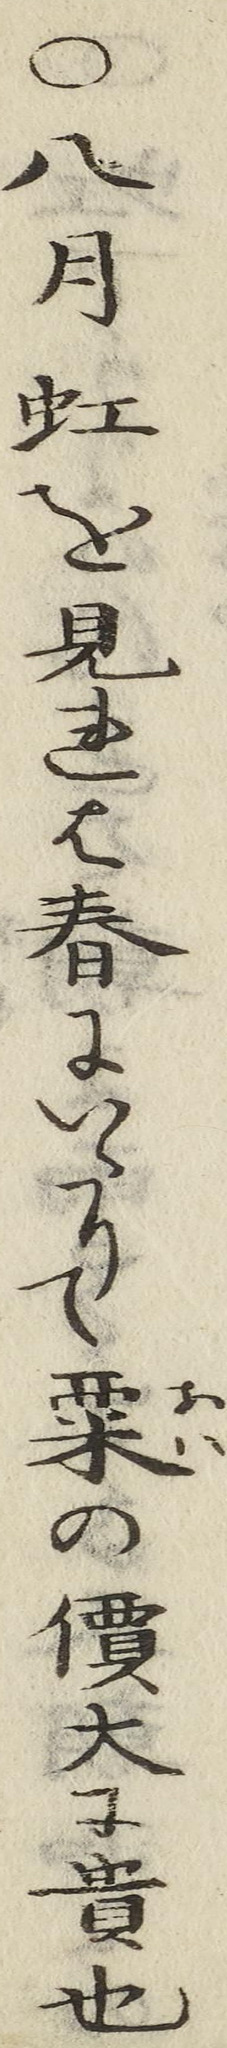○八月虹を見れは春にいたりて粟の価大に貴也
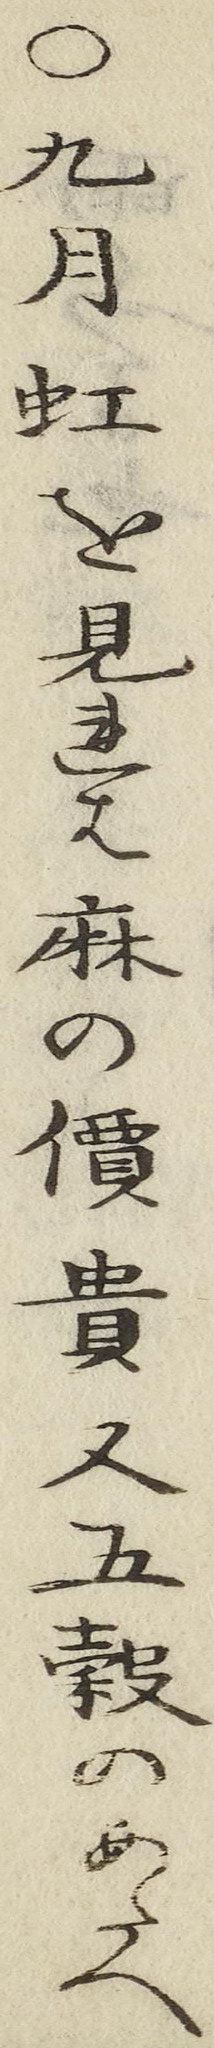○九月虹を見れは麻の価貴又五穀のあたへ
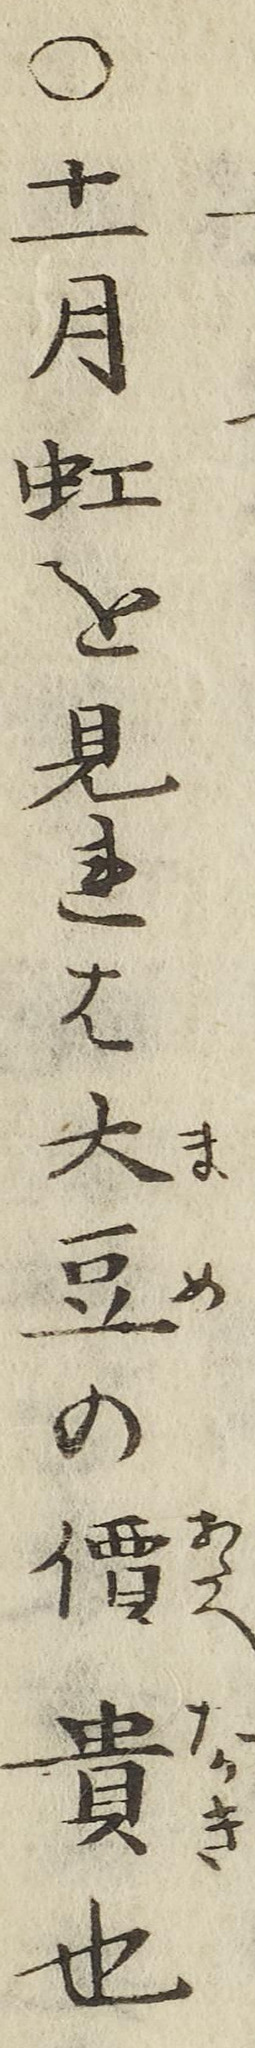○十一月虹を見れは大豆の価貴也

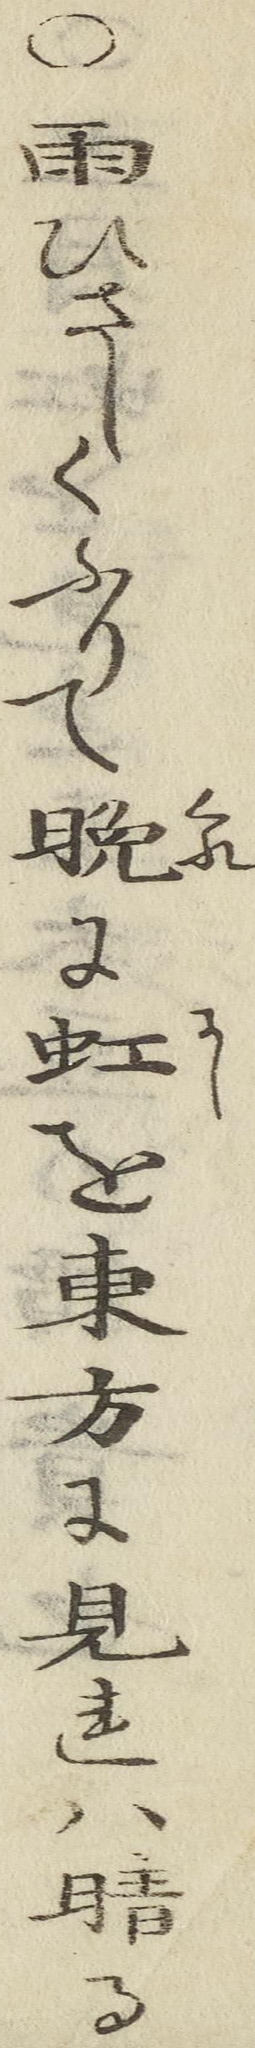○雨ひさしくふりて晩に虹を東方に見れは晴る
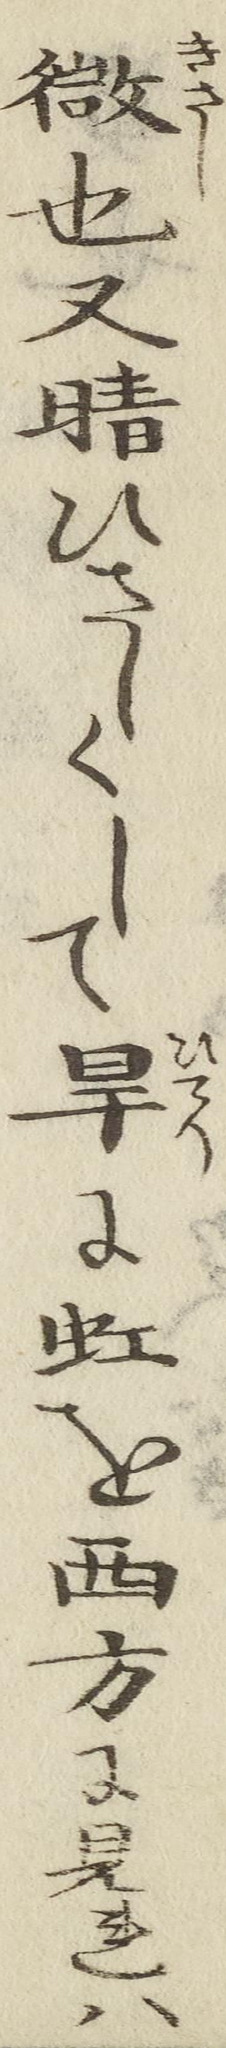徴也又晴ひさしくして旱に虹を西方に見れは
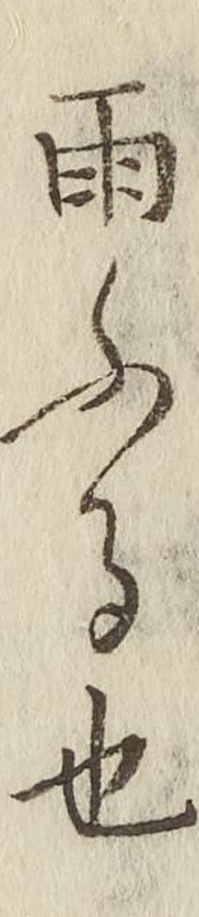雨ふる也
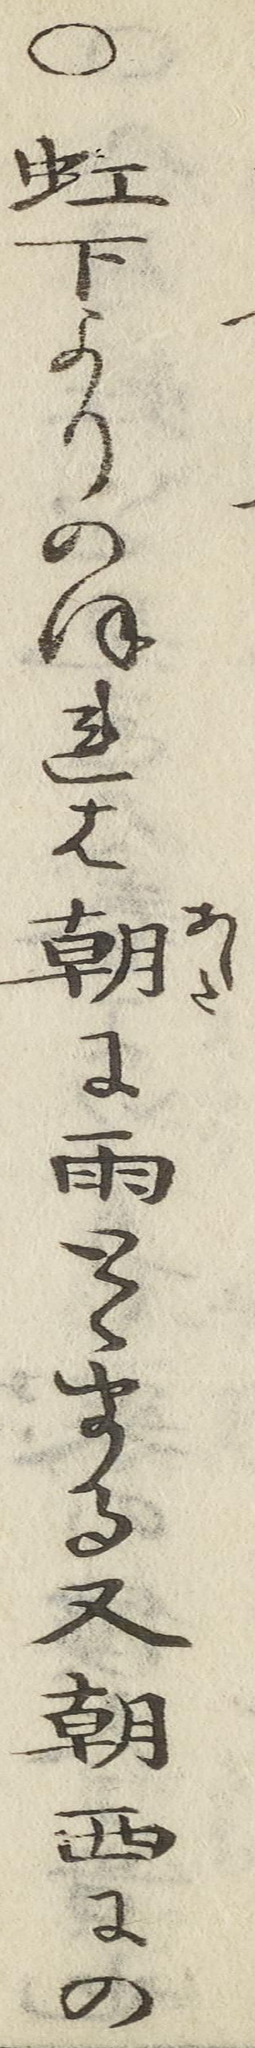○虹下よりのほれは朝に雨とゝまる又朝西にの
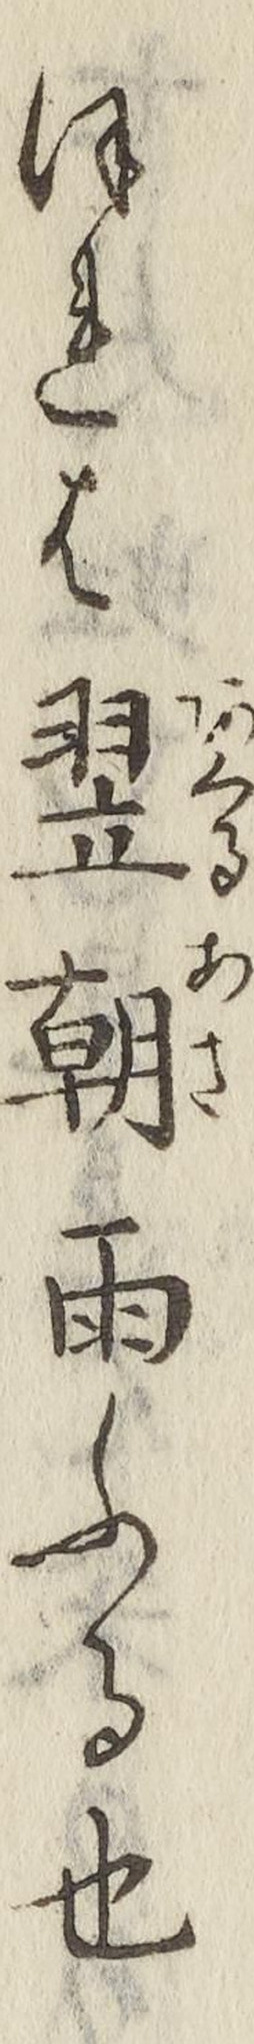ほれは翌朝雨ふる也
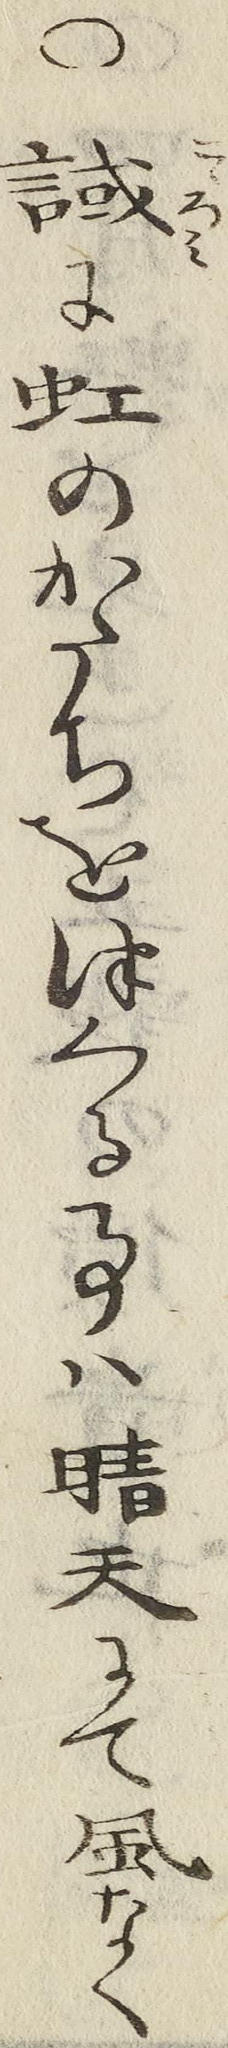○試に虹のかたちをつくる事は晴天にて風なく
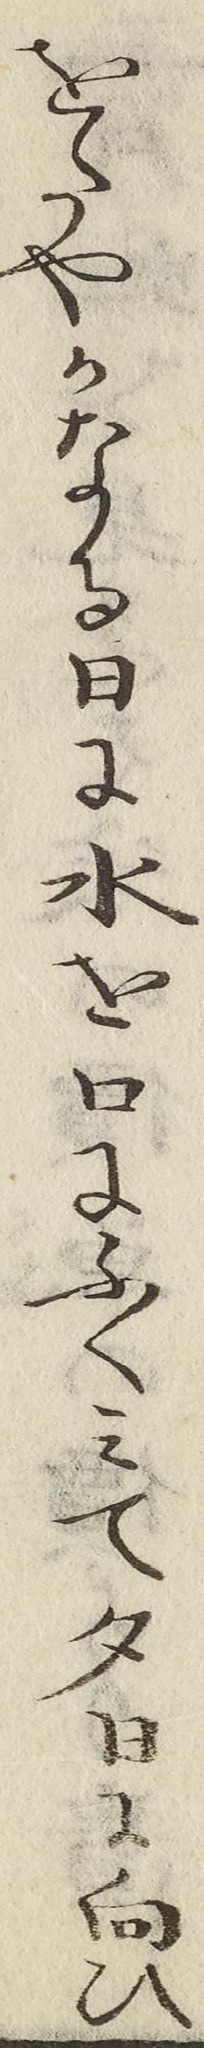をたやかなる日に水を口にふくみて夕日に向ひ
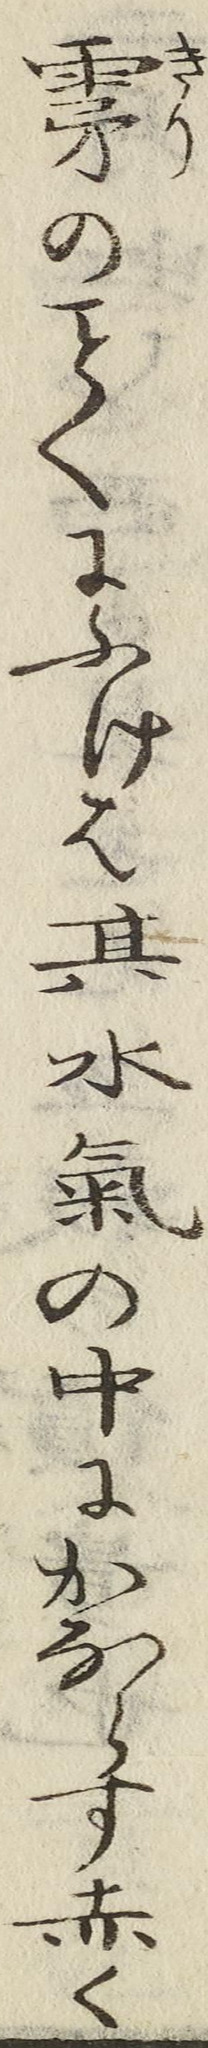霧のことくにふけは其水気の中にかならす赤く
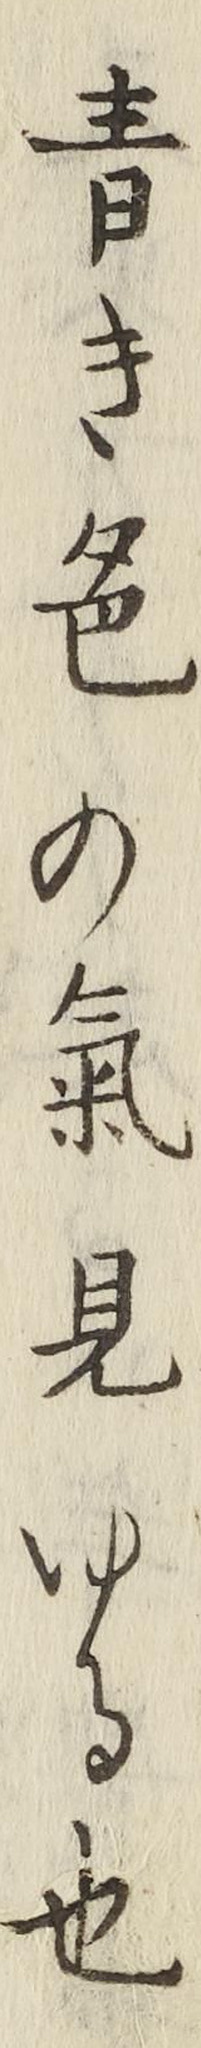青き色の気見ゆる也
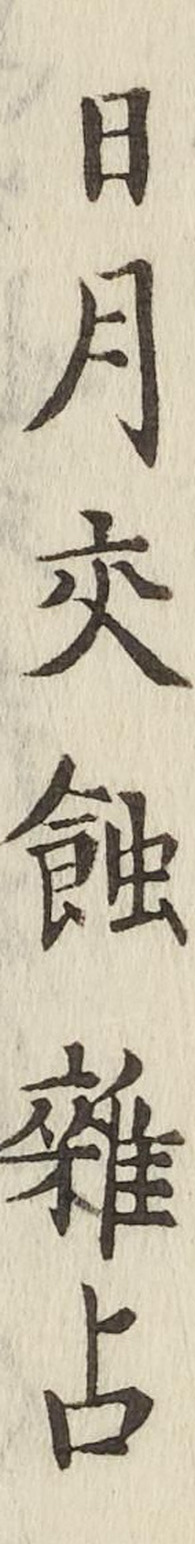日月交蝕雑占
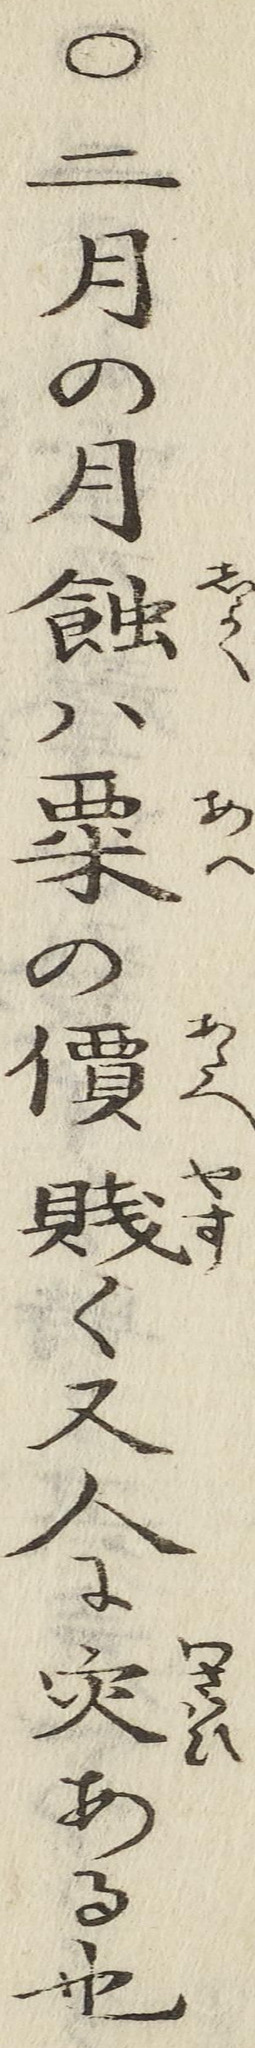○二月の月蝕は粟の価賤く又人に災ある也
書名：天時占候　二
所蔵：東京大学地震研究所図書室 Earthquake Research Institute Library, The University of Tokyo, JAPAN
